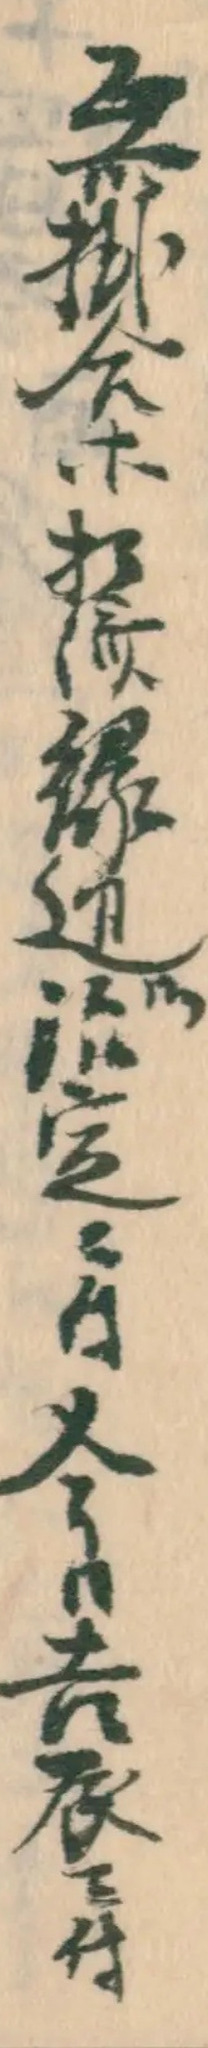互御掛合等相済縁辺御沈定ニ付今日吉辰ニ付
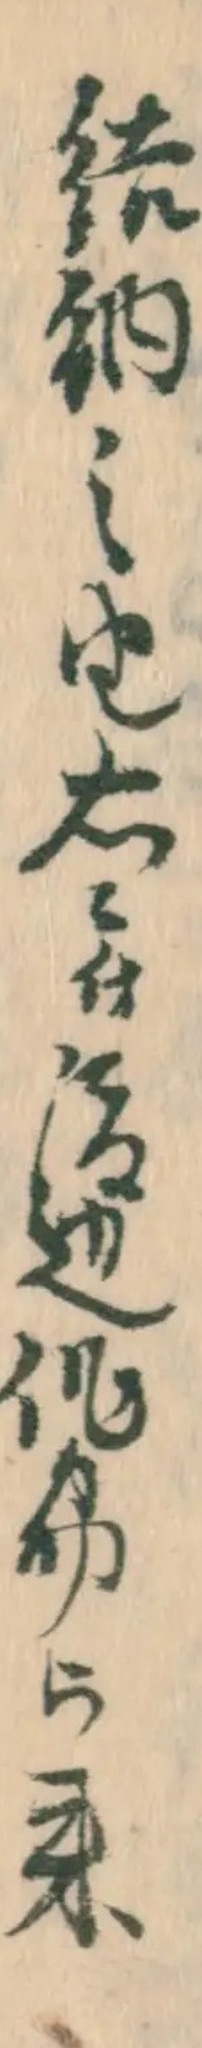結納之由右ニ付渡辺作州被参
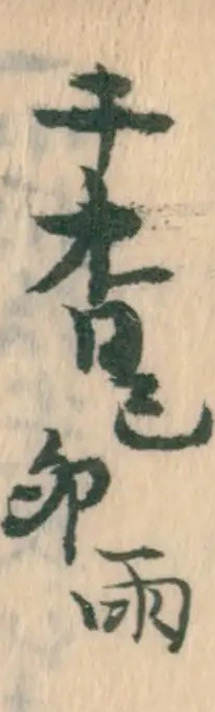廿日己卯雨
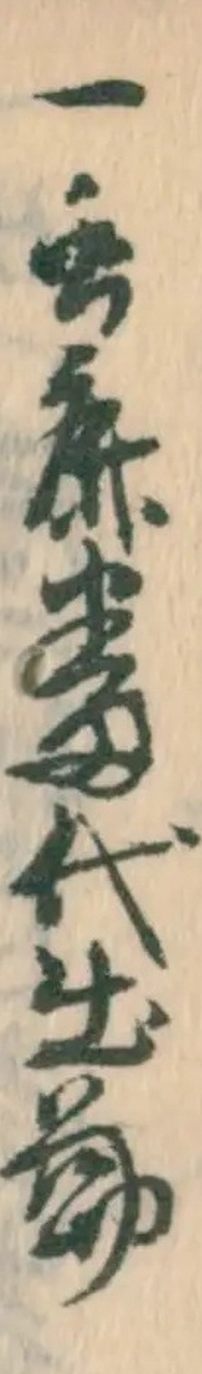一虫鹿番代出勤
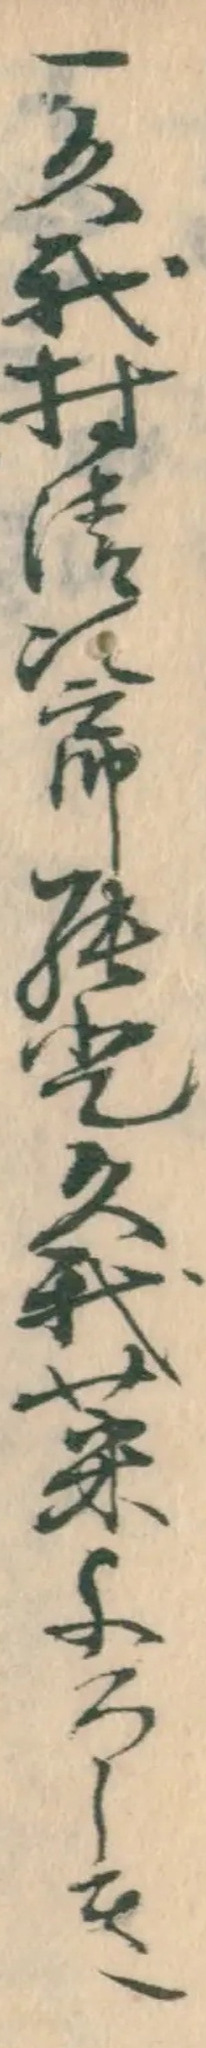一久我村清次郎罷登久我菜よろしき
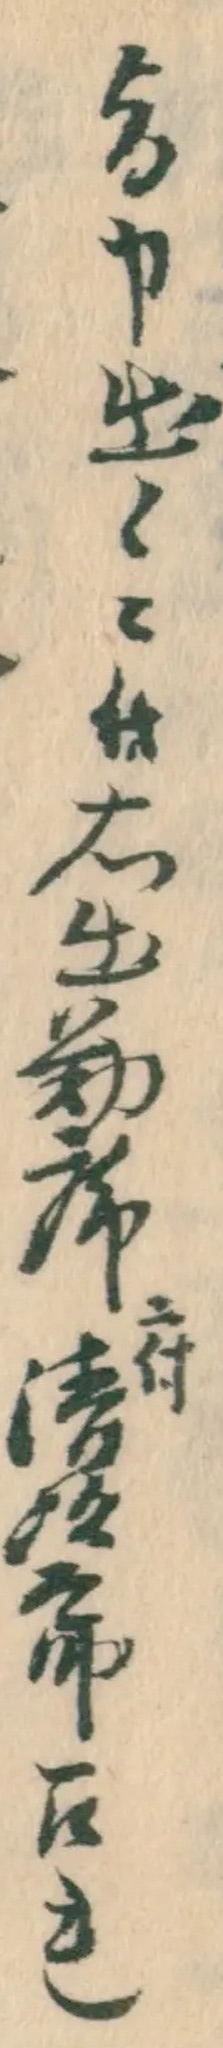旨申出候ニ付右出勤序ニ付清次郎召連
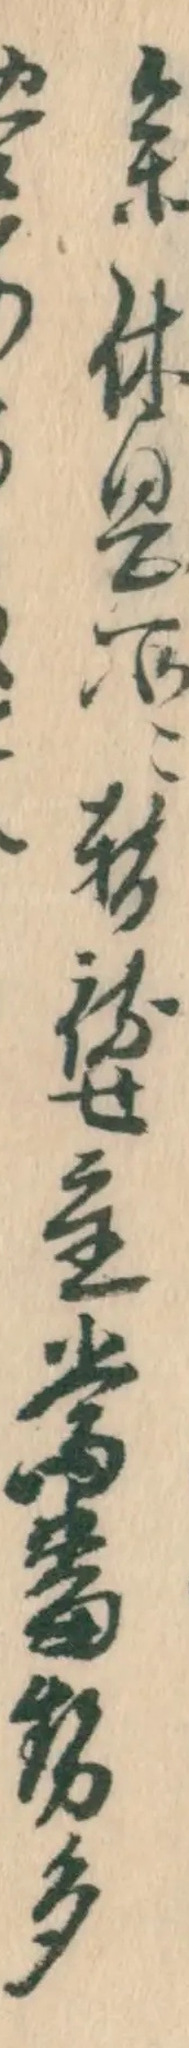参休息所ニ暫待せ置当番勢多
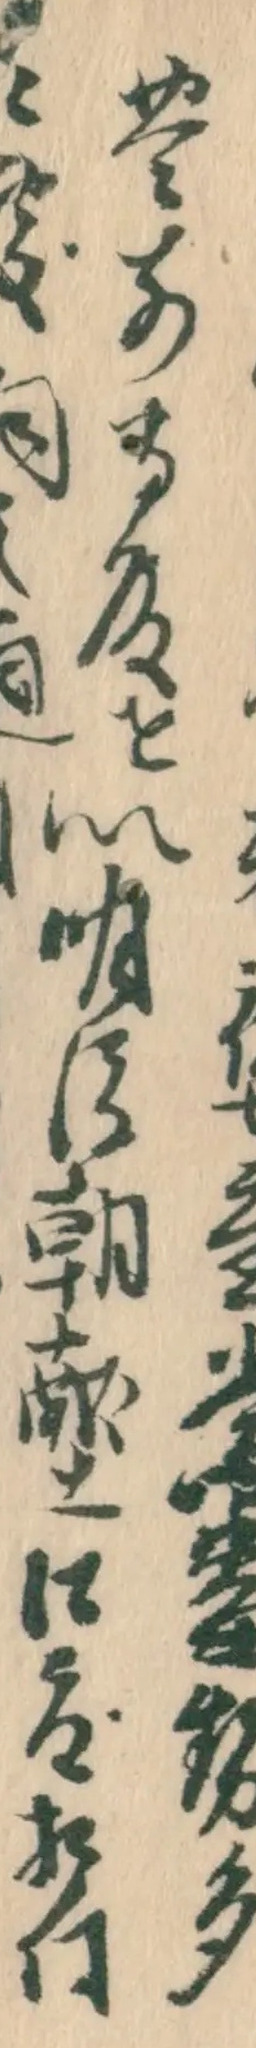豊前守殿を以明後朝献上仕度相伺
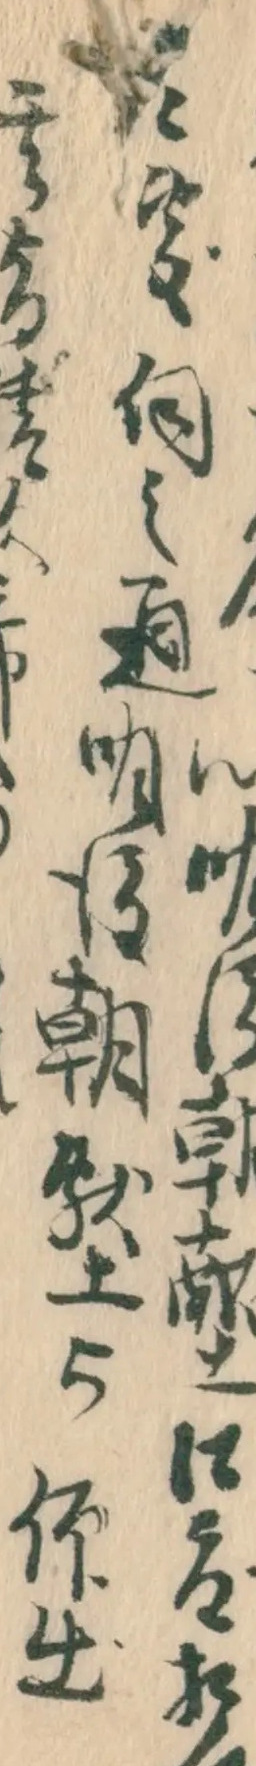候処伺之通明後朝献上被仰出
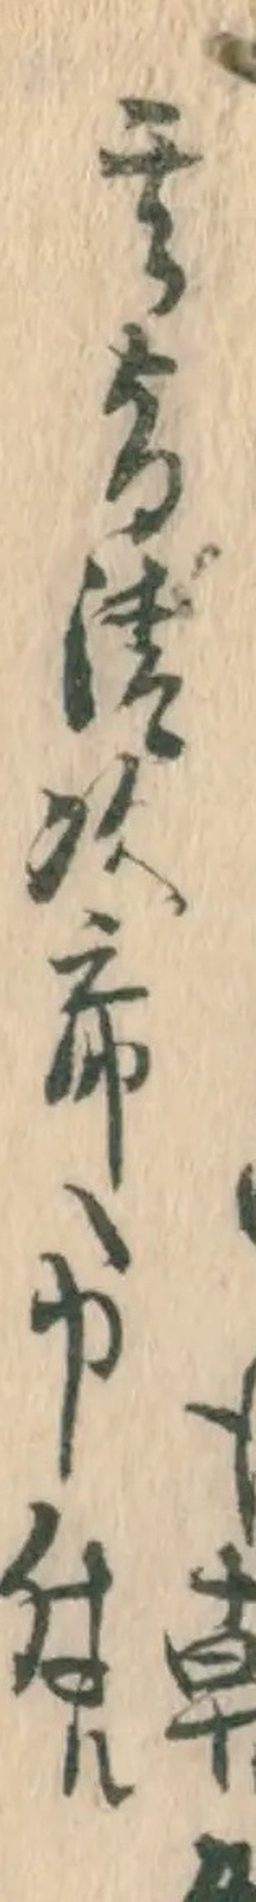其旨清次郎へ申付ル

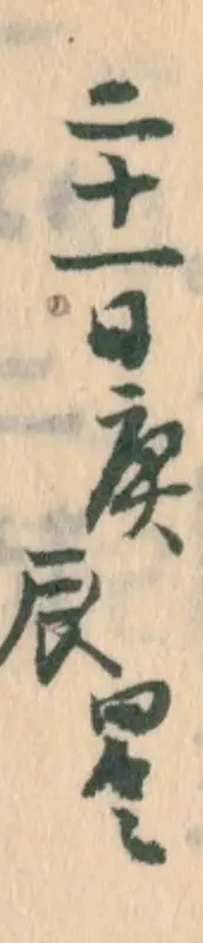二十一日庚辰雲
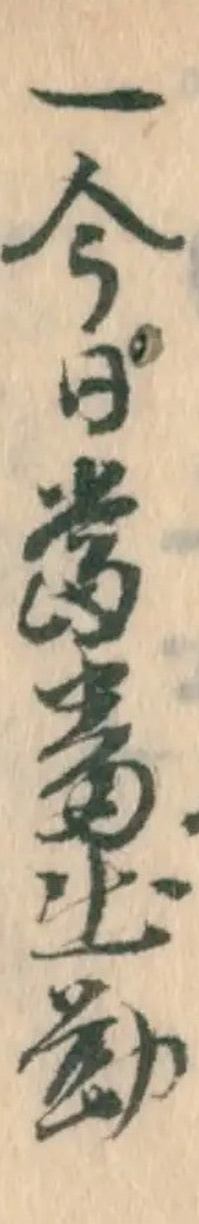一今日当番出勤
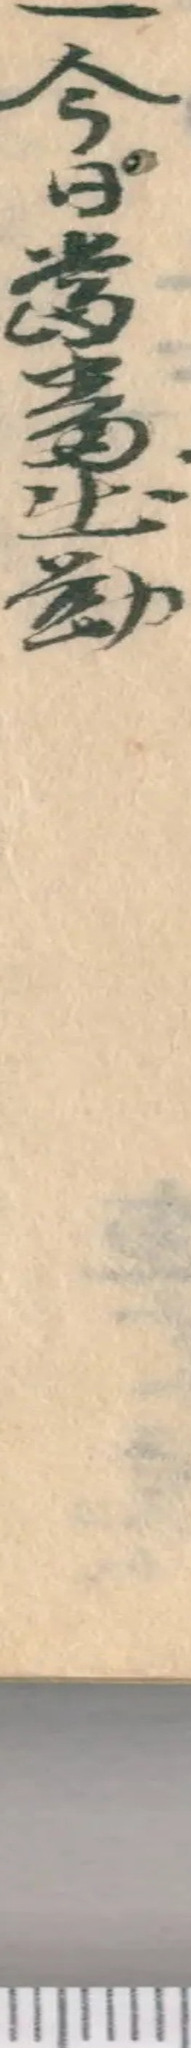一今日当番出勤
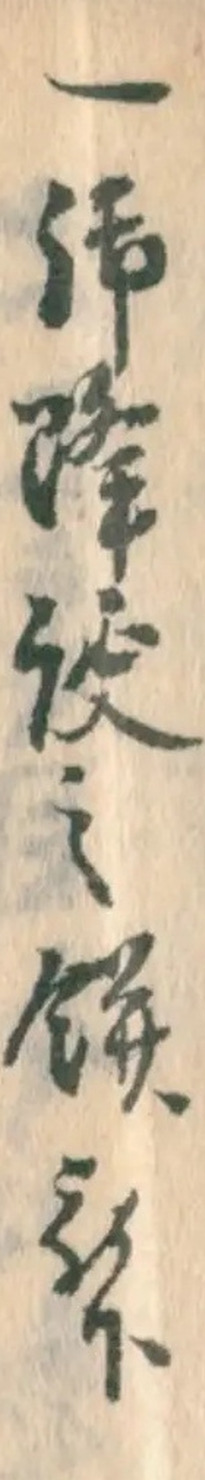一御降誕之餅被下
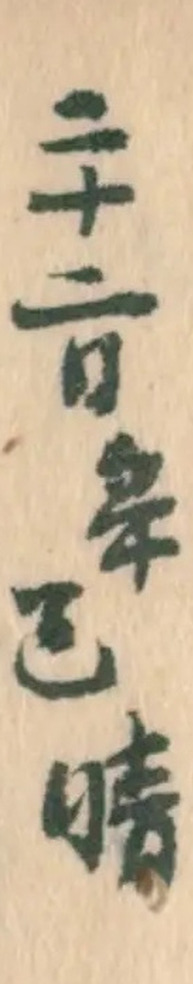二十二日辛巳晴
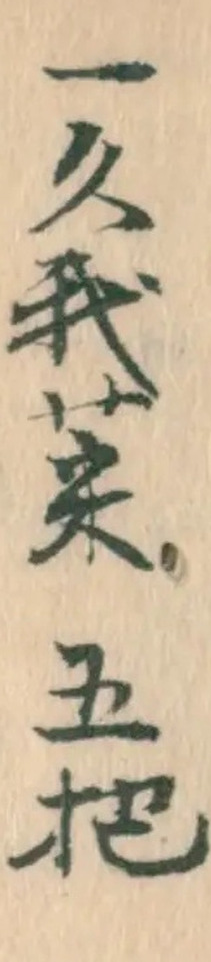一久我菜五把
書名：禁裏御所御用日記. [131]
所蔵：国立国会図書館 National Diet Library, JAPAN
